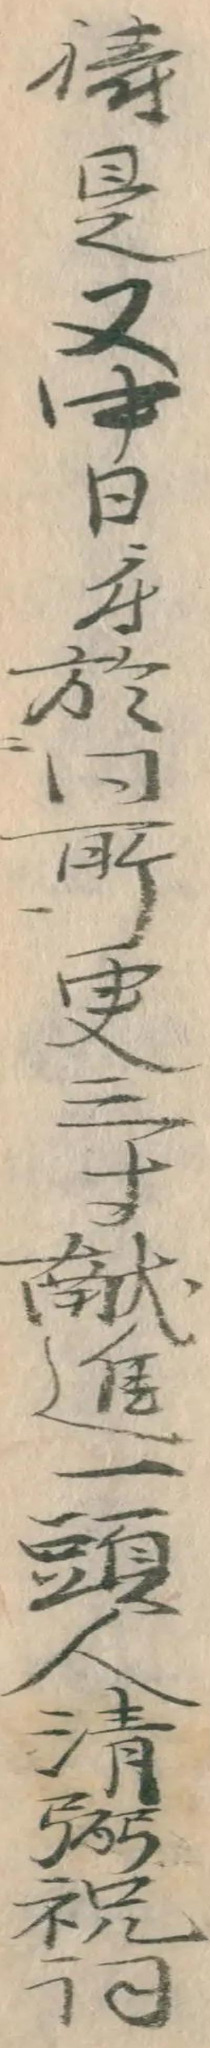待是又中日ニ付於同所更三寸献進一頭人清弼祝詞

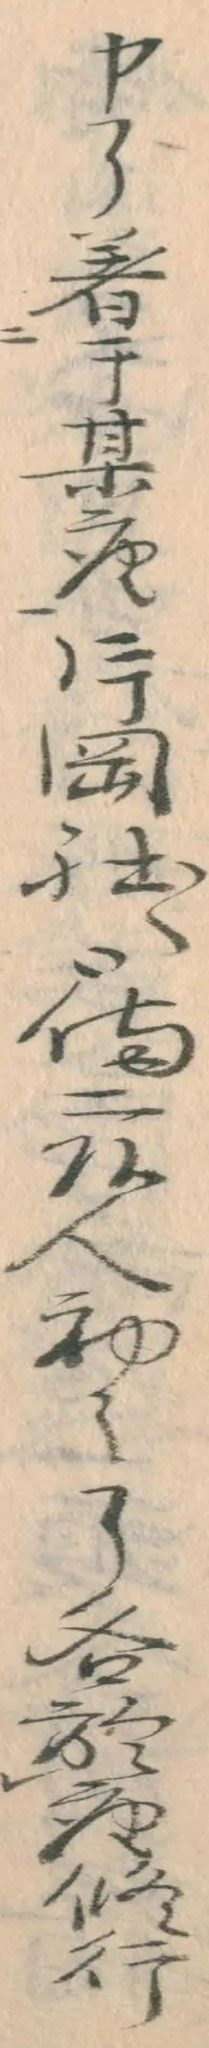申了着于某座片岡社へ御備二頭人初之了各於座修行
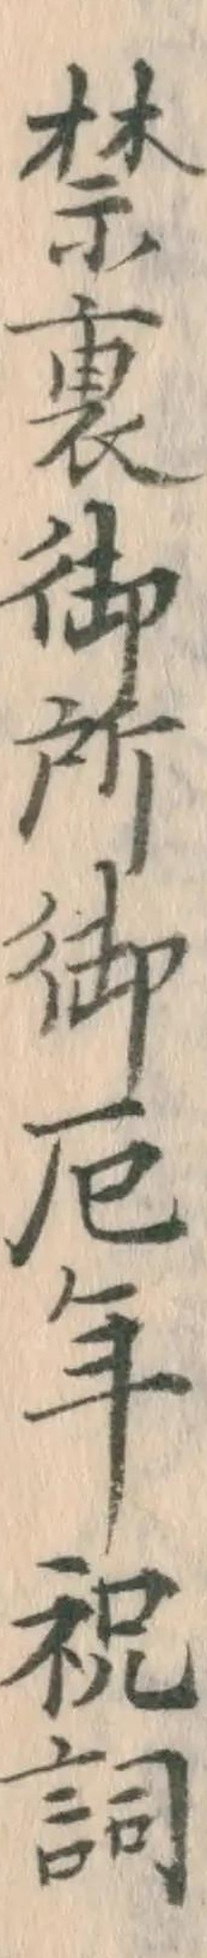禁裏御所御厄年祝詞
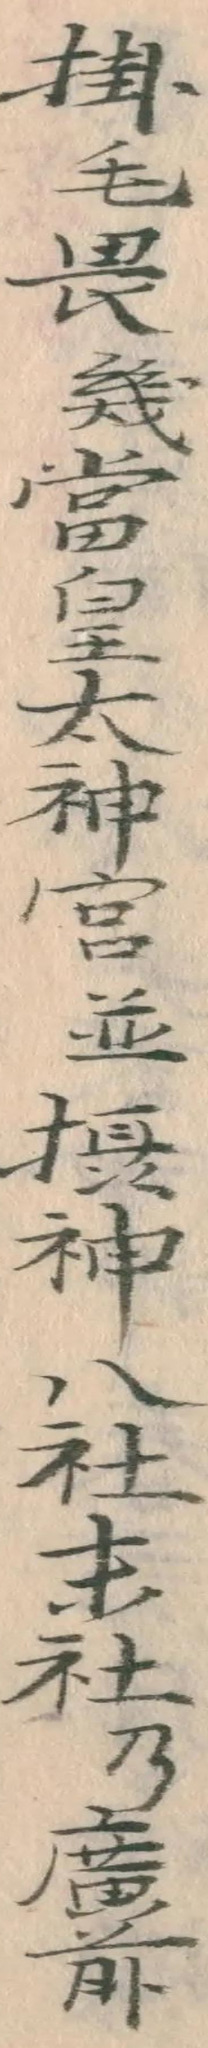掛毛畏幾當皇太神宮並摂神八社末社乃廣前
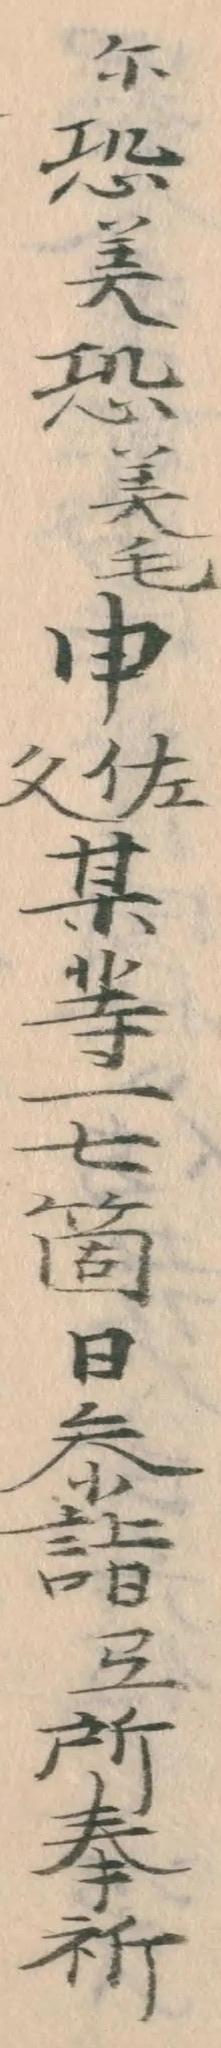尓恐美恐美毛申佐久某等一七箇日参詣弖所奉祈
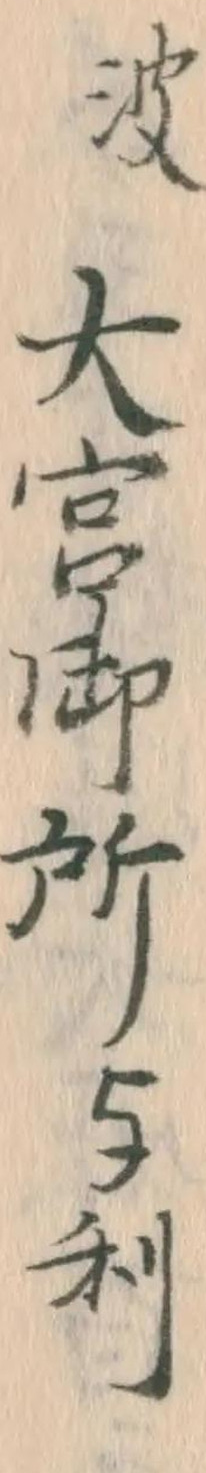波大宮御所与利
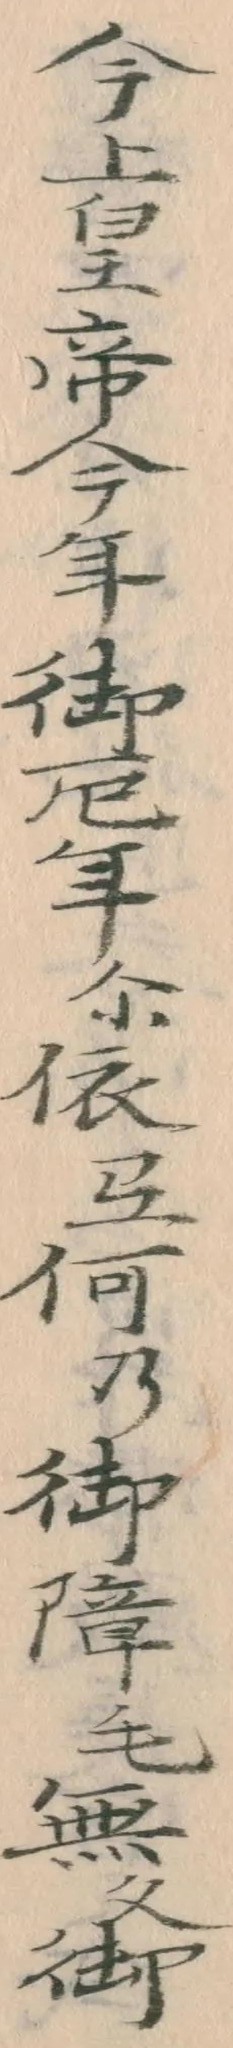今上皇帝今年御厄年尒依弖何乃御障毛無久御
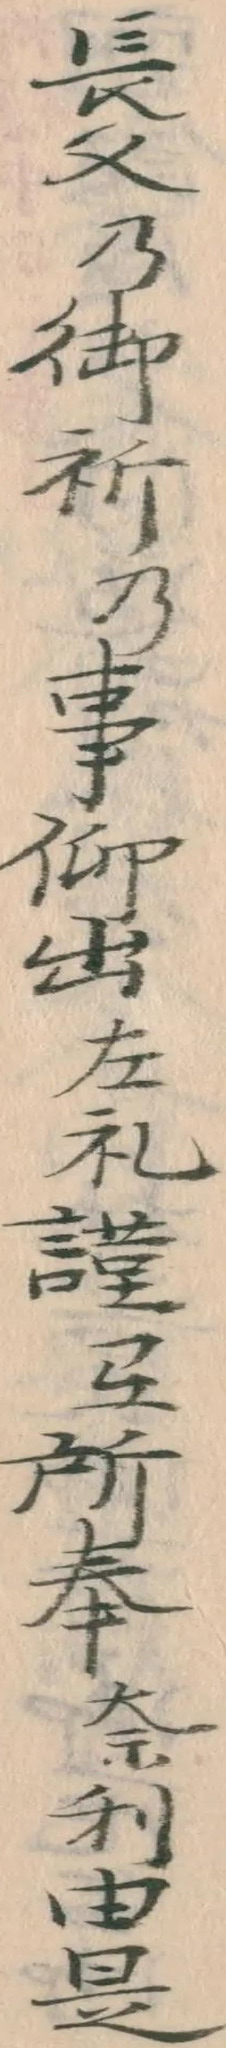長久乃御祈乃事仰出左礼謹弖所奉奈利由是
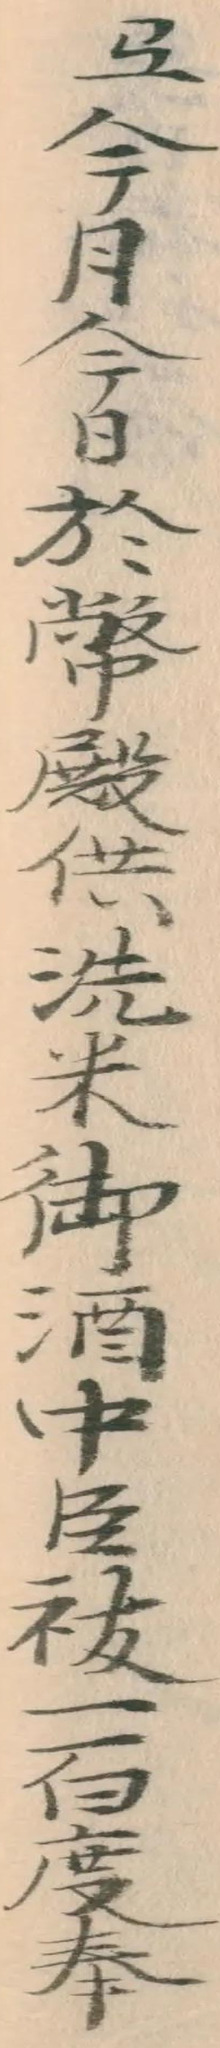弖今月今日於幣殿供洗米御酒中臣祓一百度奉
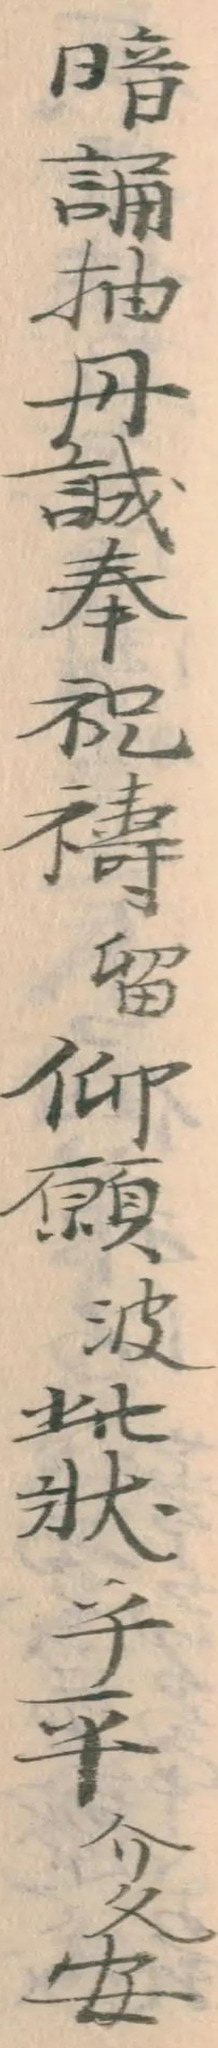暗誦抽丹誠奉祝祷留仰願波此状乎平介父安
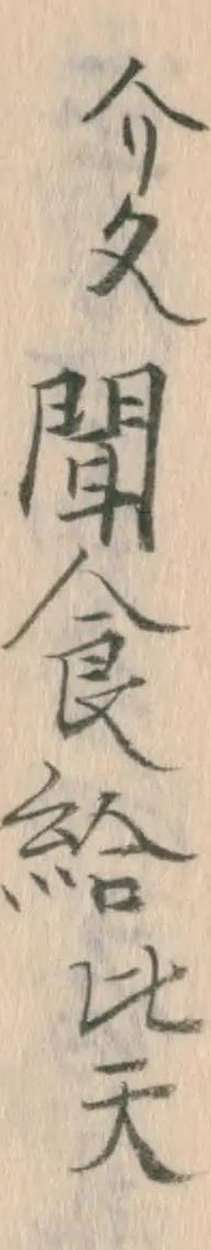介久聞食給比天
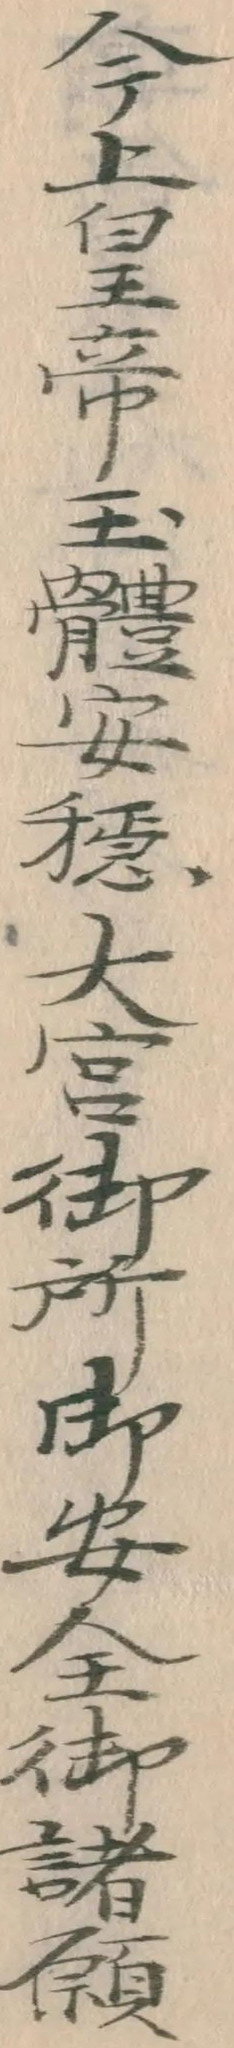今上皇帝玉體安穏大宮御所御安全御諸願
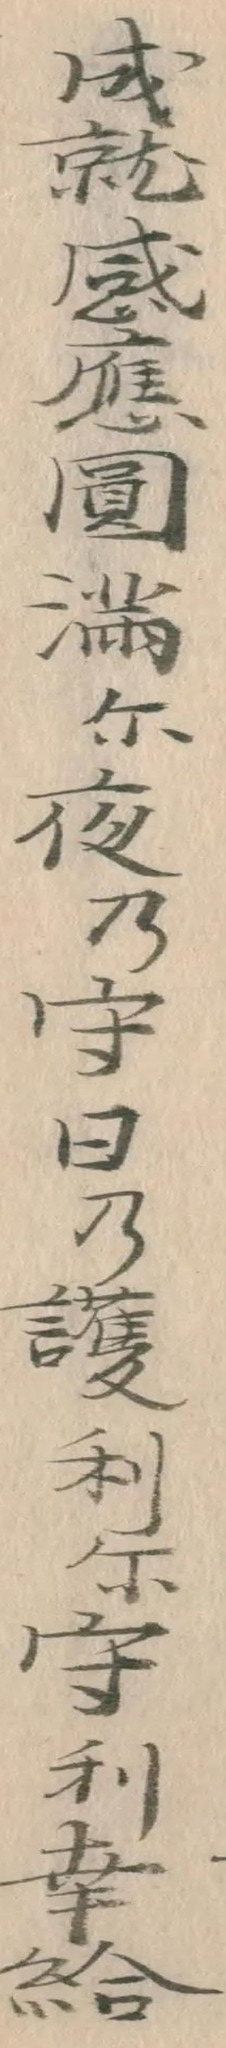成就感應圓満尓夜乃守日乃護利尓守利幸給
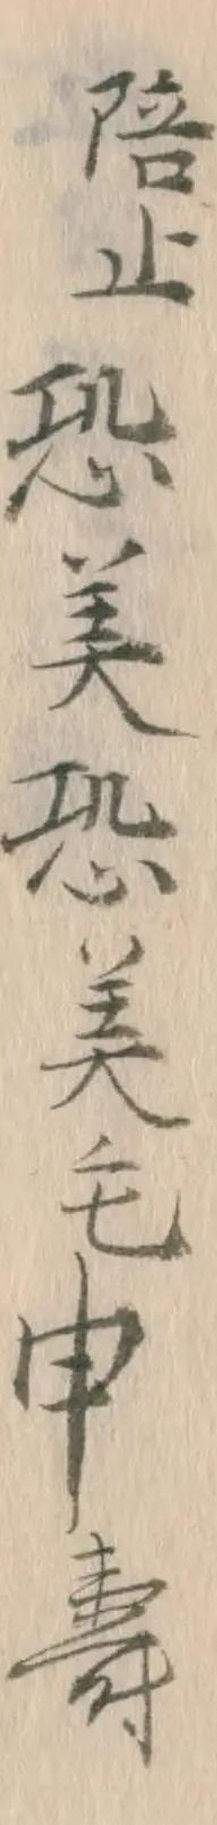陪止恐美恐美毛申寿
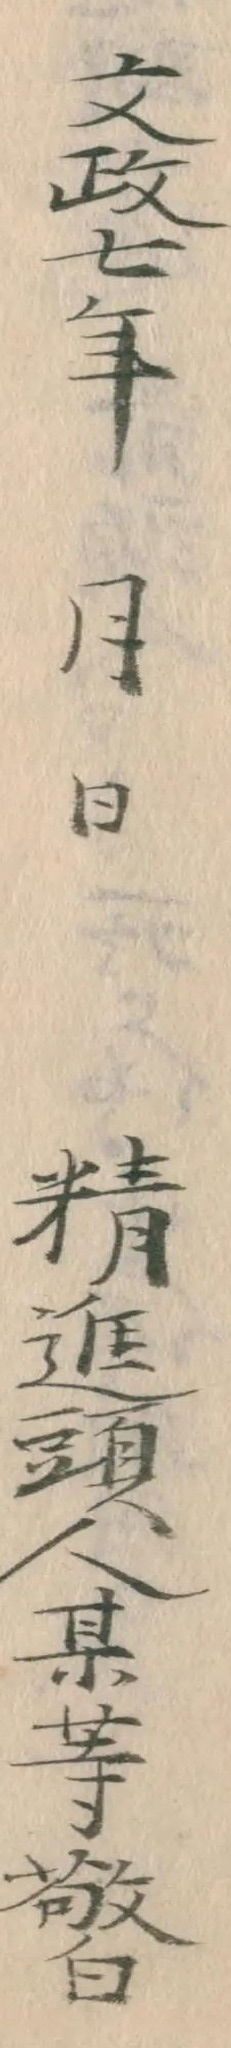文政七年月日精進頭人某等敬白
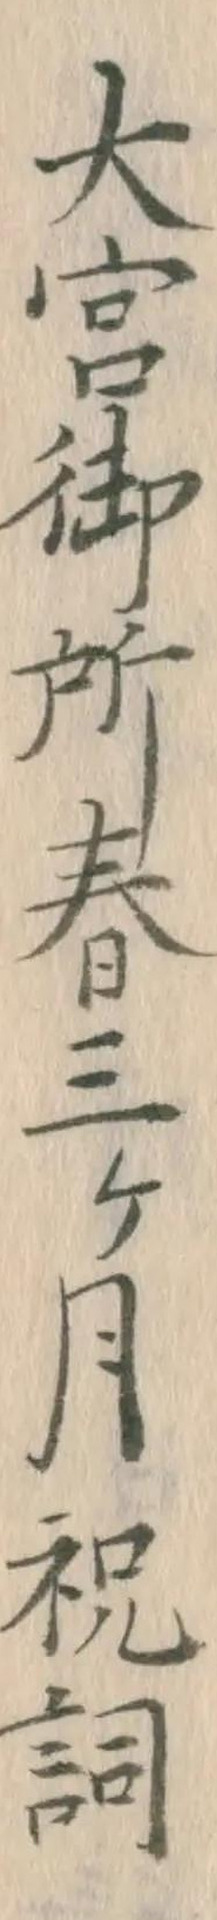大宮御所春三ケ月祝詞
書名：賀茂社記録. 第72冊
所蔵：国立国会図書館 National Diet Library, JAPAN
